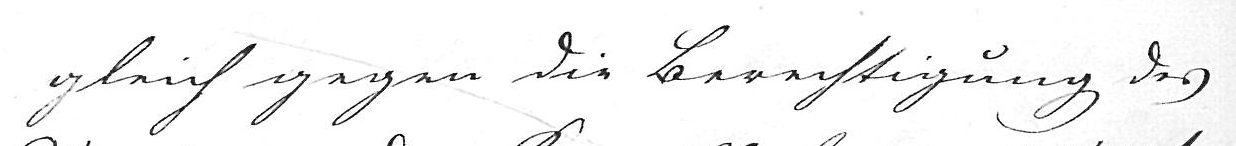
gleich gegen die Berechtigung des
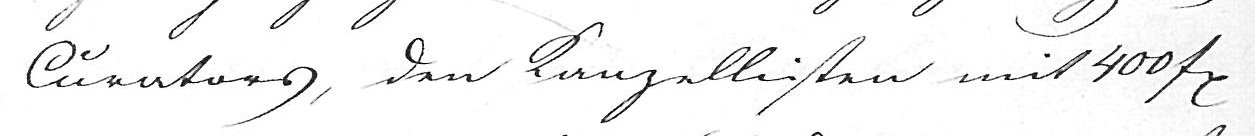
Curators, den Kanzellisten mit 400 fr
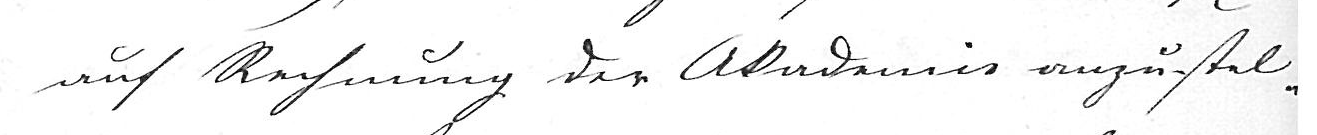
auf Rechnung der Akademie anzustel-
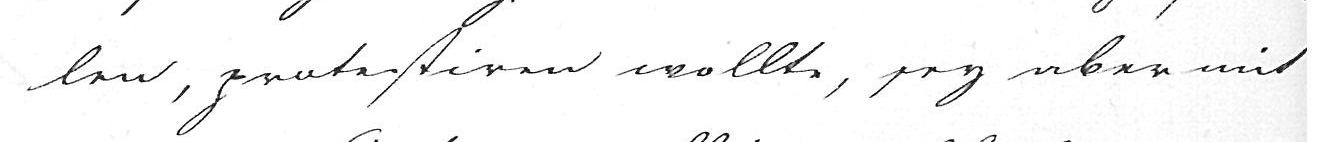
len, protestiren wollte, sey aber mit
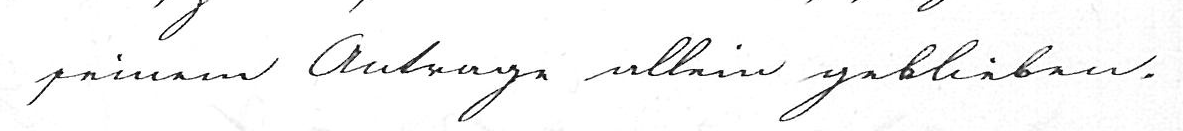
seinem Antrage allein geblieben.
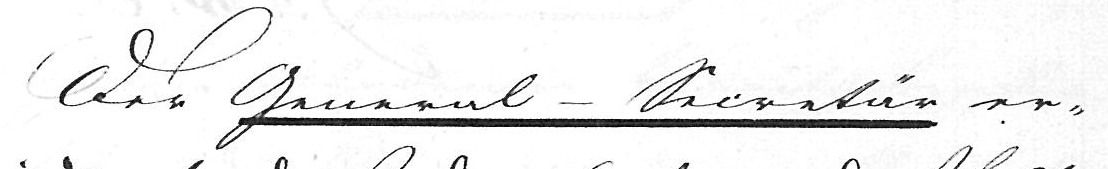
Der General-Secretär er-
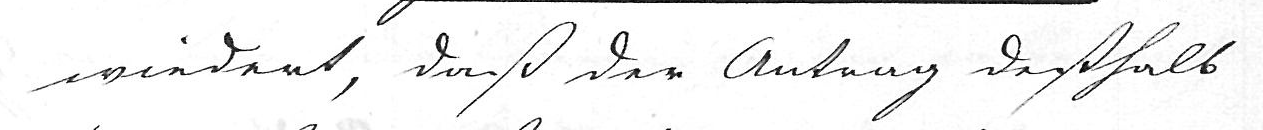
wiedert, daß der Antrag deßhalb
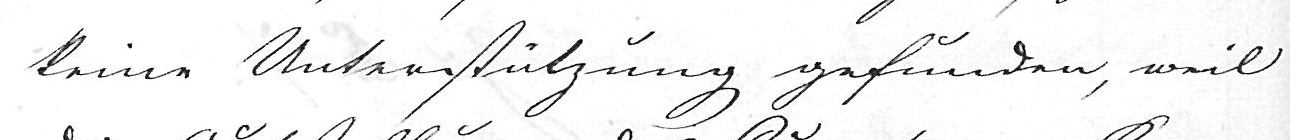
keine Unterstützung gefunden, weil
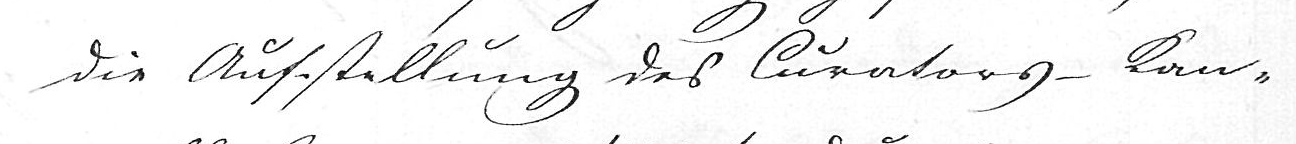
die Aufstellung des Curators-Kan-
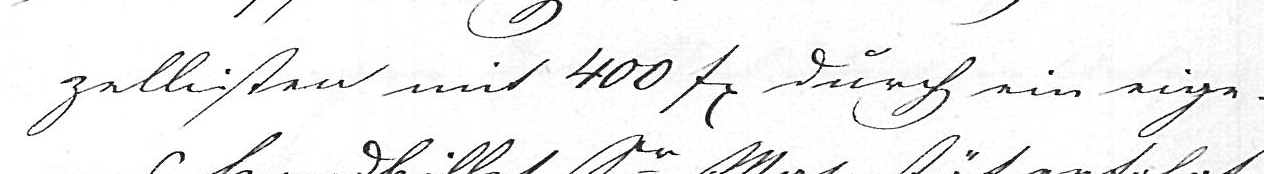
zellisten mit 400 fl durch ein eige-
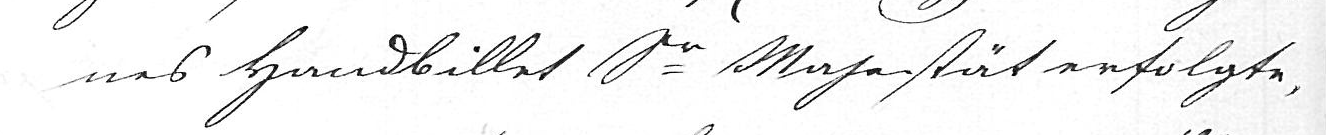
nes Handbillet Sr Majestät erfolgte,
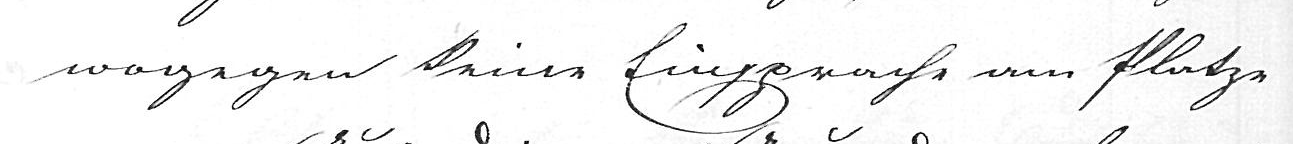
wogegen keine Einsprache am Platze
